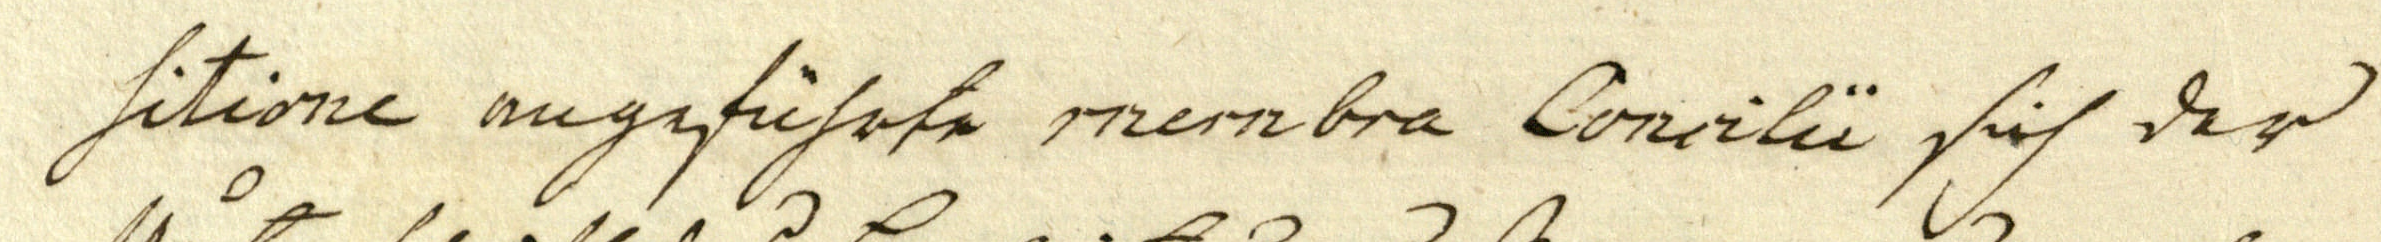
sitione angeführte membra Concilii sich der
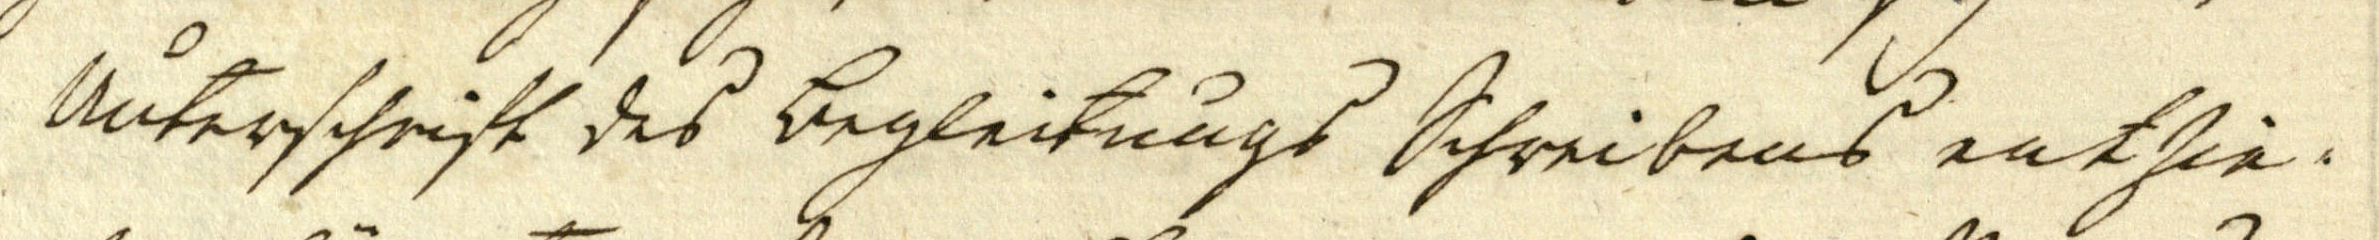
Unterschrift des Begleitungs Schreibens entzie¬
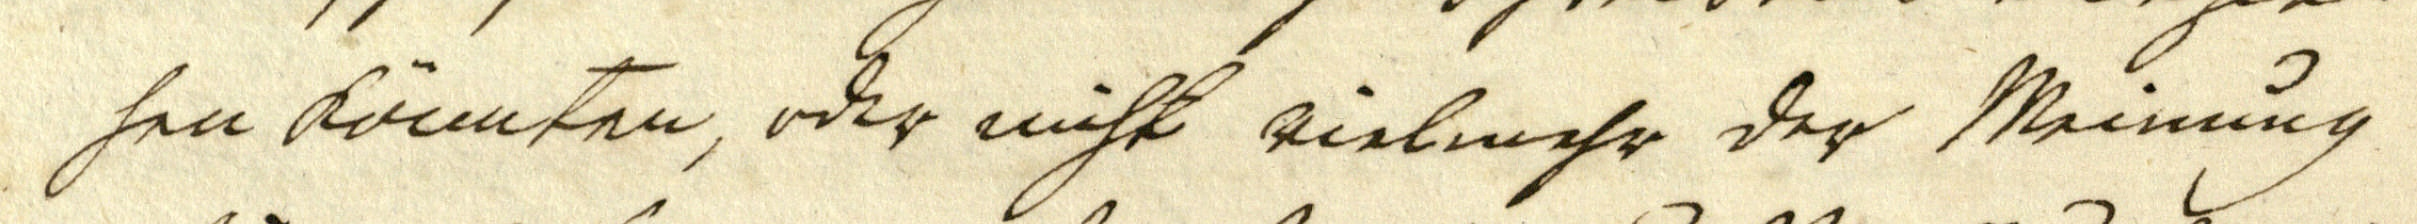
hen könnten, oder nicht vielmehr der Meinung
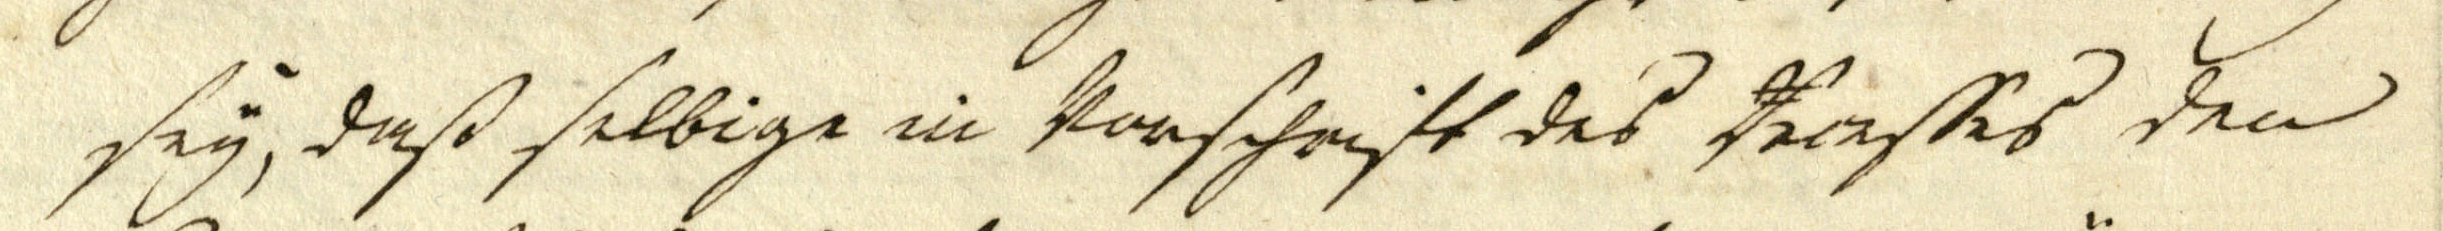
seÿ, daß selbige in Vorschrift des Recesses den
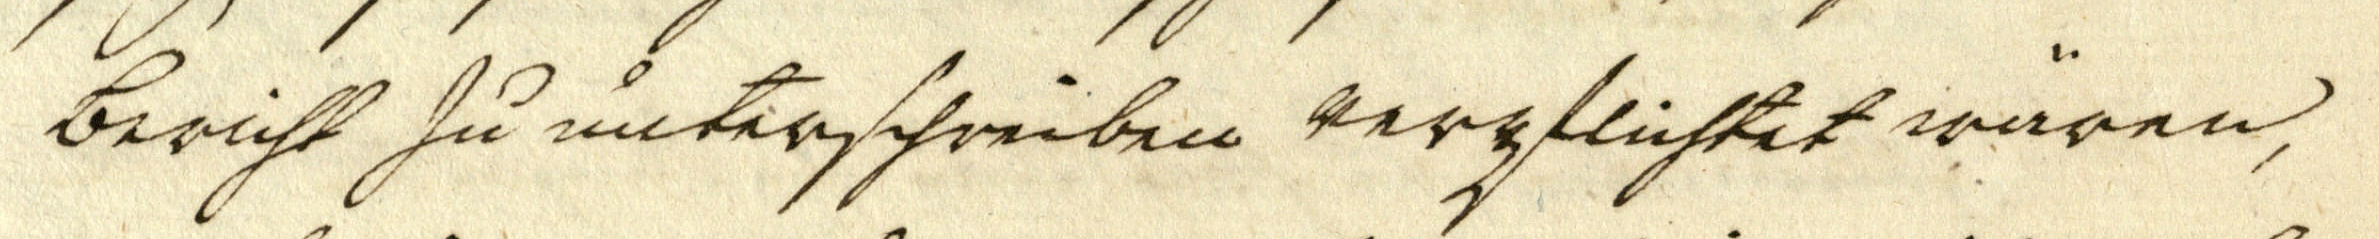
Bericht zu unterschreiben verpflichtet wären,
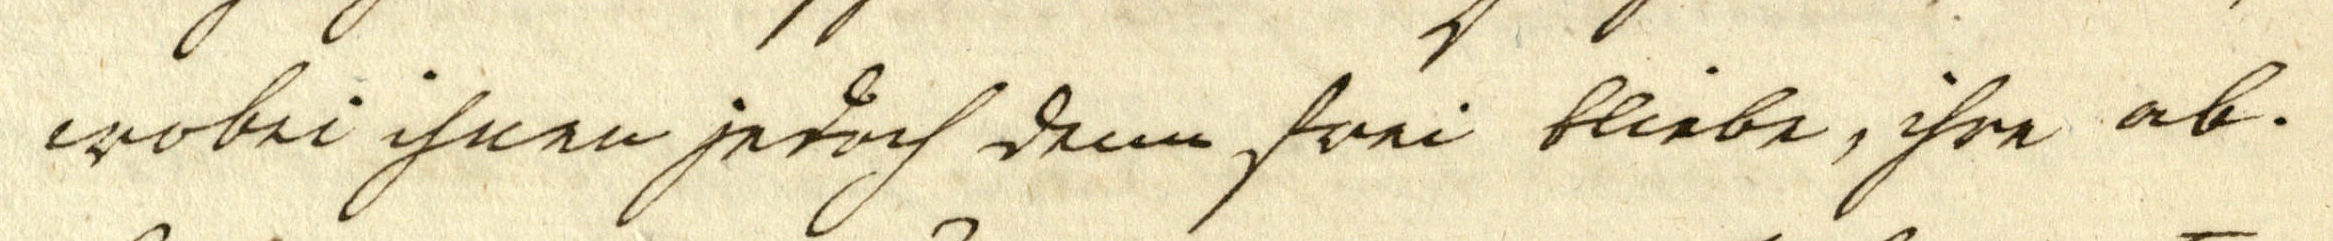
wobei ihnen jedoch denn frei bliebe, ihre ab¬
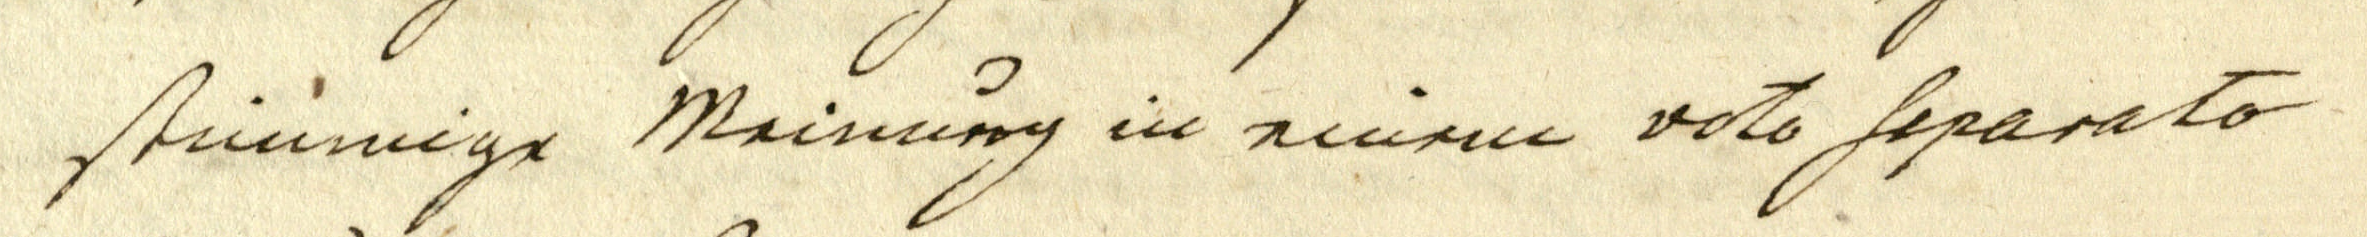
stimmige Meinung in einem voto separato
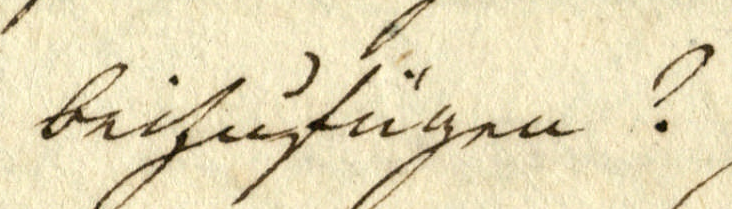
beizufügen?
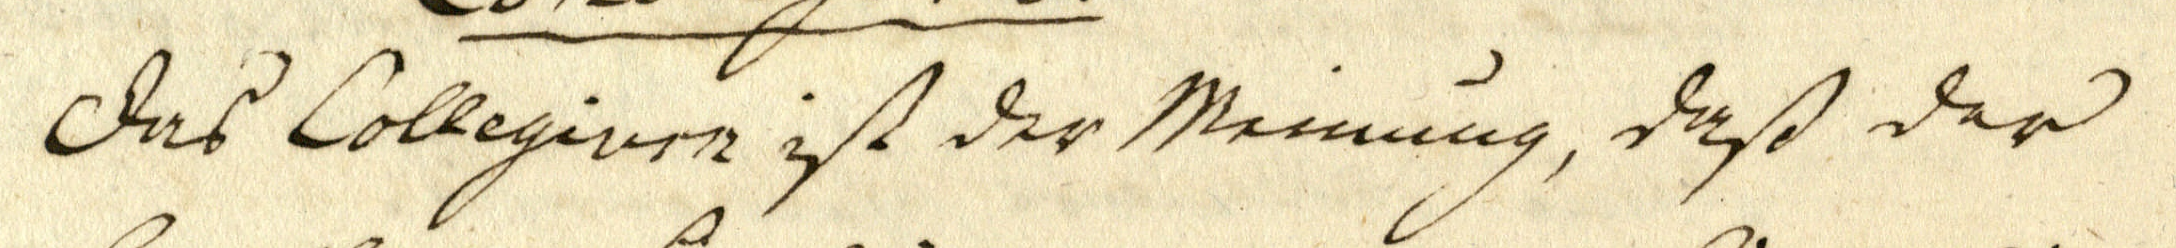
Das Collegium ist der Meinung, daß der
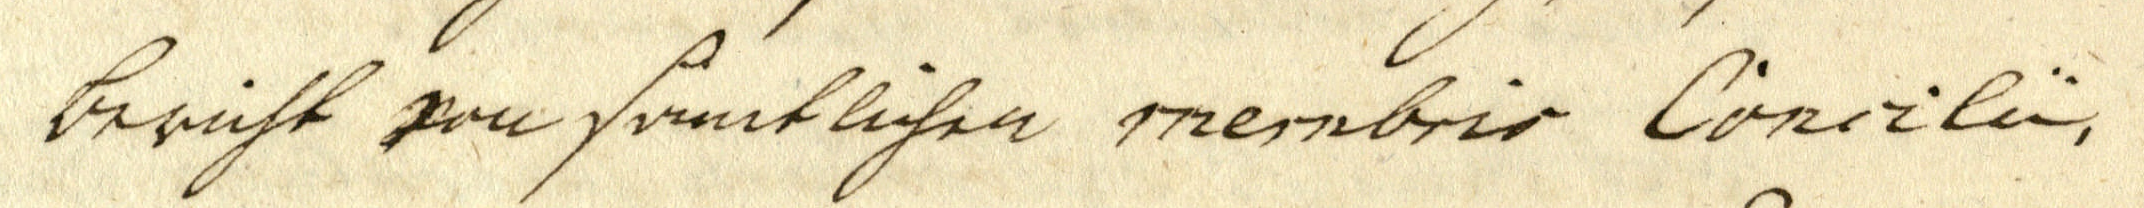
Bericht von sämtlichen membris Concilii,
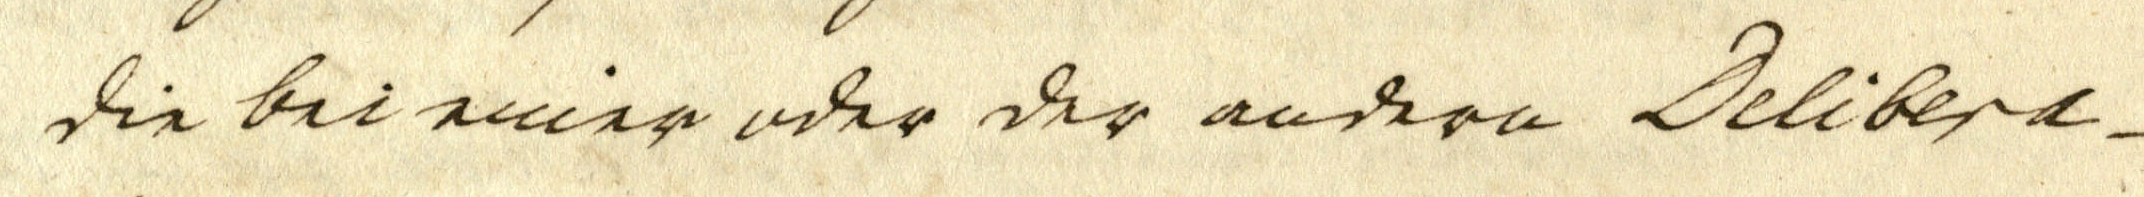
die bei einer oder der andern Delibera¬
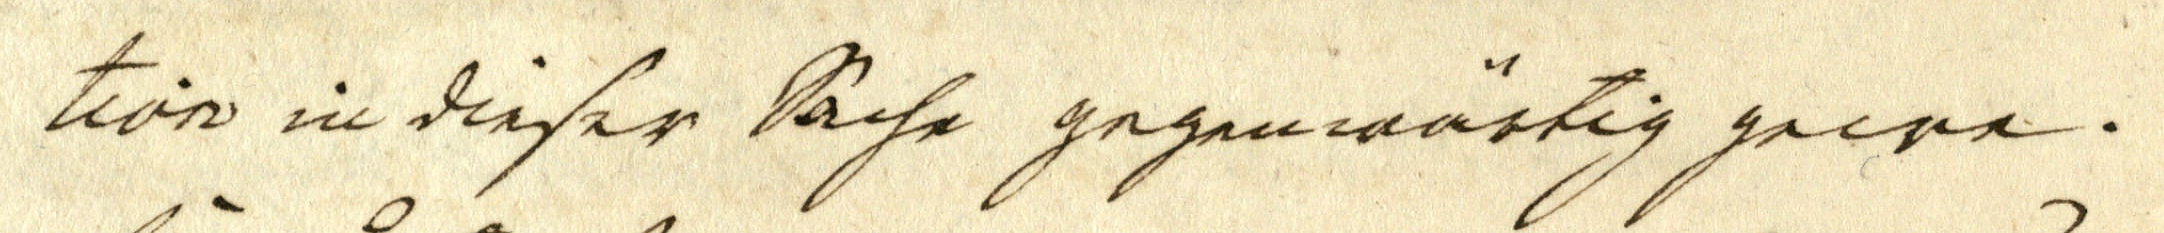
tion in dieser Sache gegenwärtig gewe¬
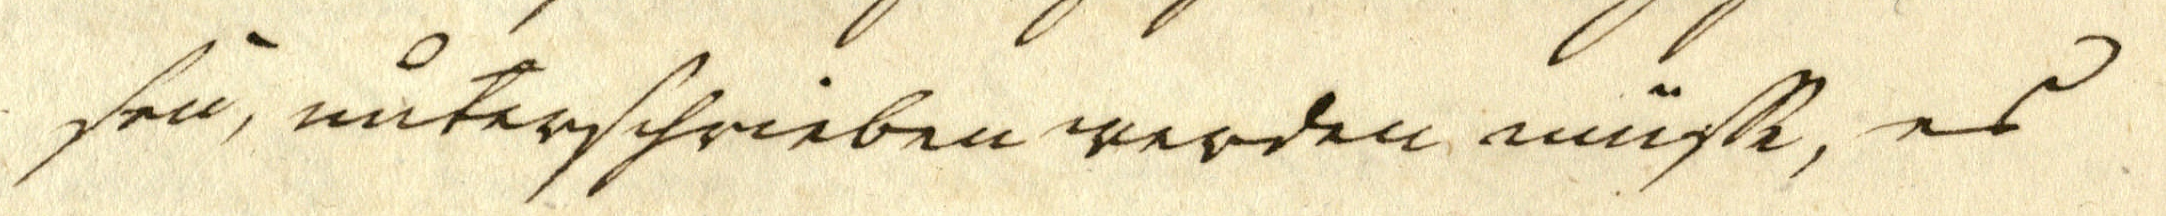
sen, unterschrieben werden müsse, es
